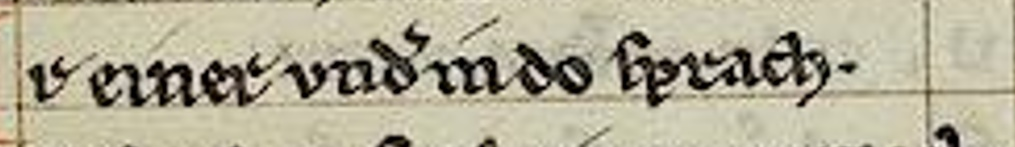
*Ir einer vnd(er) in do ſprach.
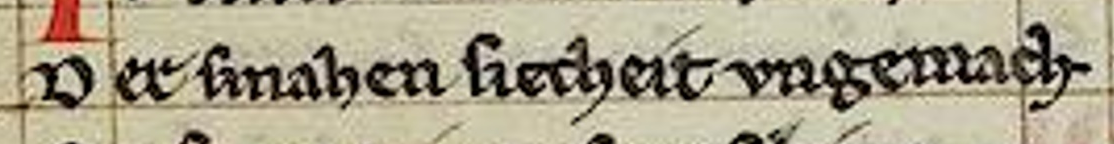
Der ſmahen ſiecheit vngemach.
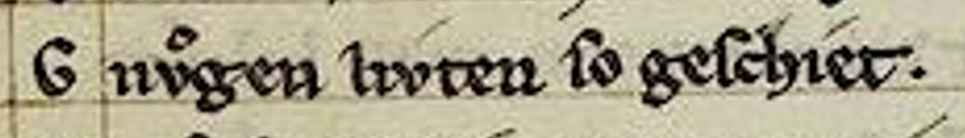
Gnv°ogen livten ſo geſchiet.
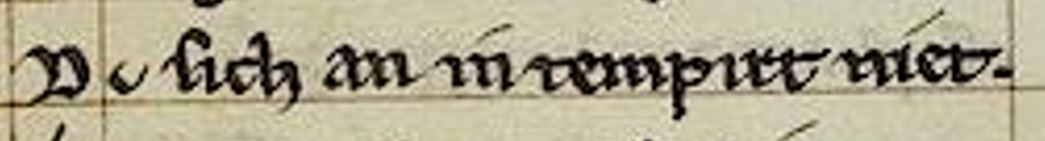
D(az) ſich an in tempirt niet.
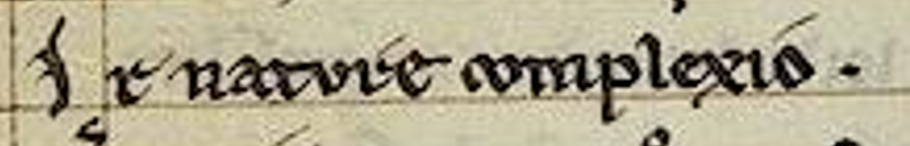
Ir natvre complexio.
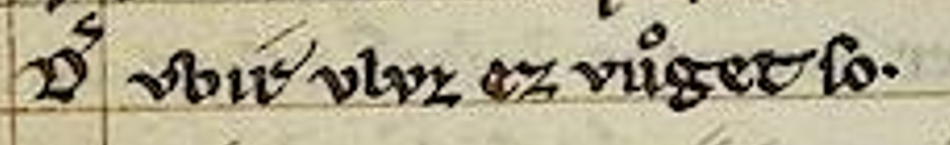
D(er) vbir vlvz ez vu°oget ſo.
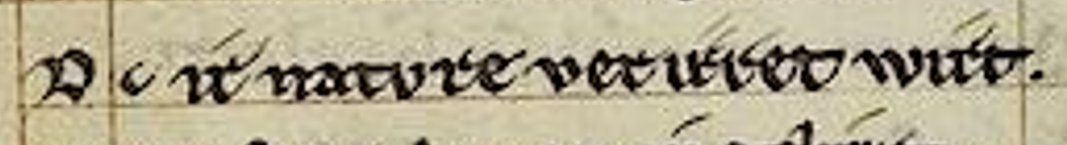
D(az) ir natvre ver irret wirt.
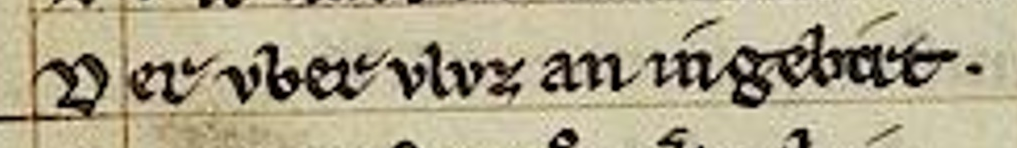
Der vber vlvz an in gebirt.
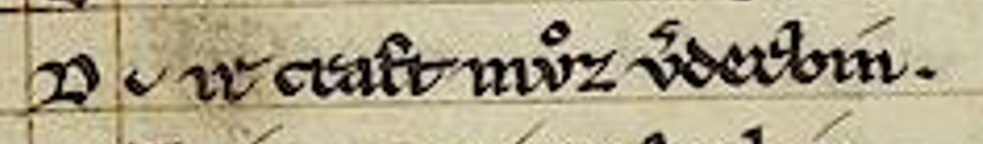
D(az) ir craft mv°oz v(er)derbin.
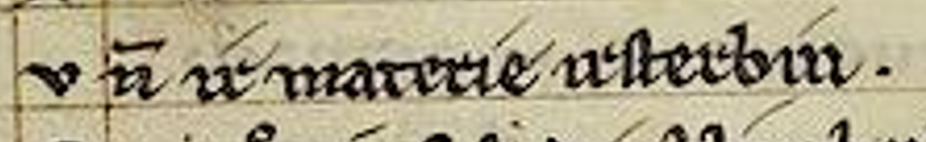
Vn(d) ir materie irſterbin.
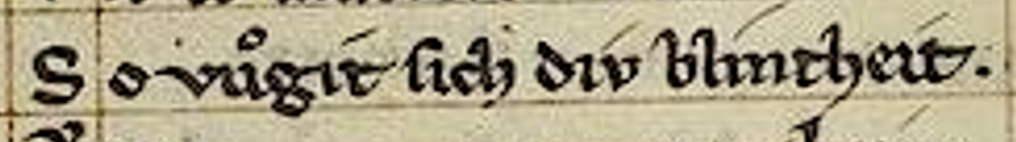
So vu°ogit ſich div blintheit.
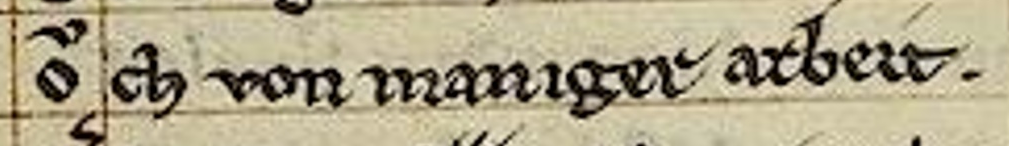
O°vch von maniger arbeit.
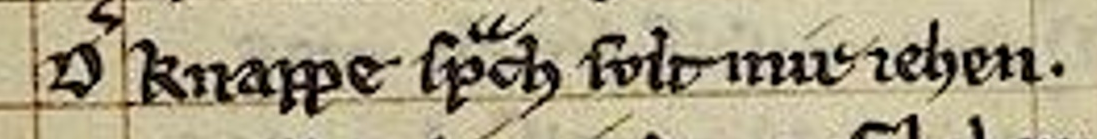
D(er) knappe ſp(ra)ch ſvlt mir iehen.
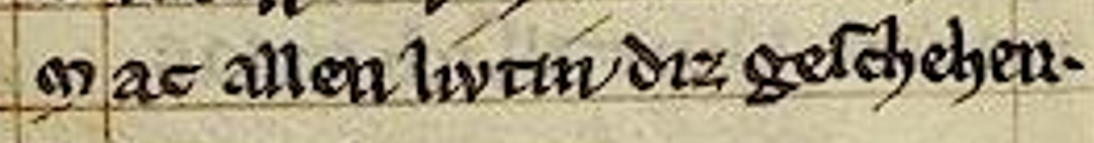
Mac allen livtin diz geſchehen.
